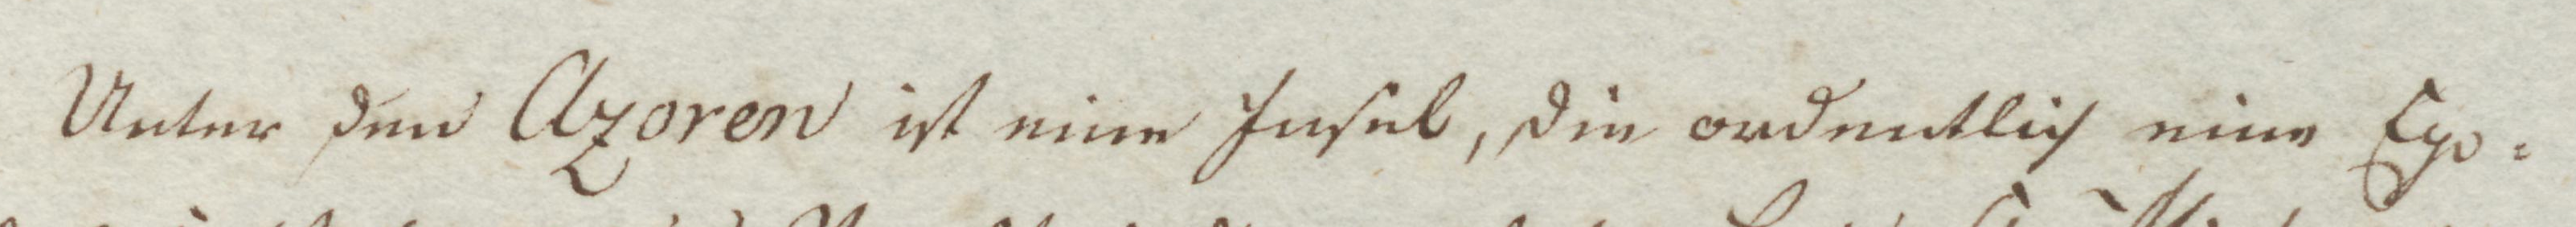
Unter den Azoren ist eine Insel, die ordentlich eine Epo-
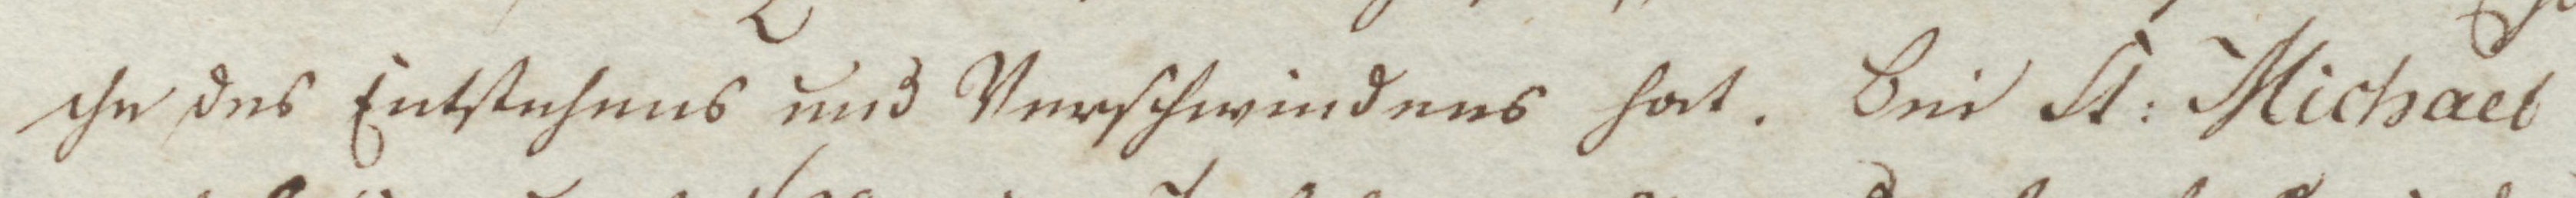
che des Entstehens und Verschwindens hat. Bei St: Michael
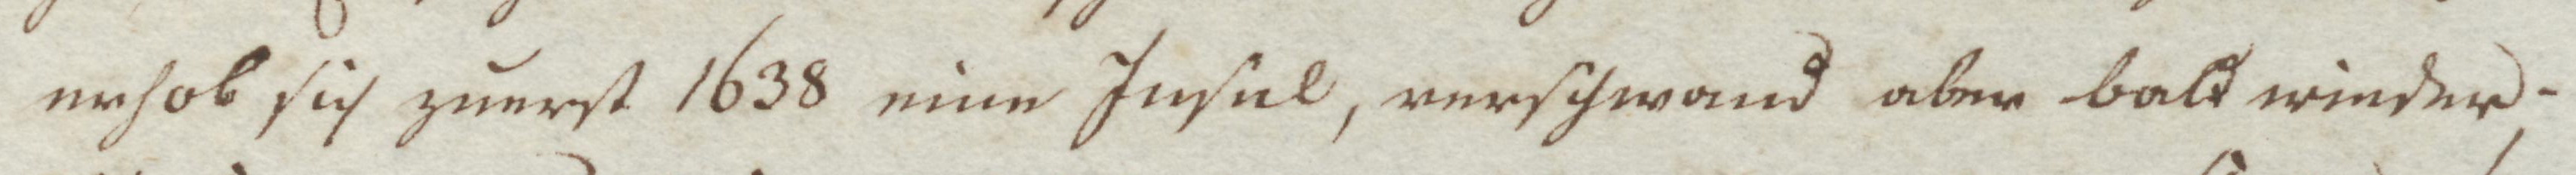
erhob sich zuerst 1638 eine Insel, verschwand aber bald wieder;
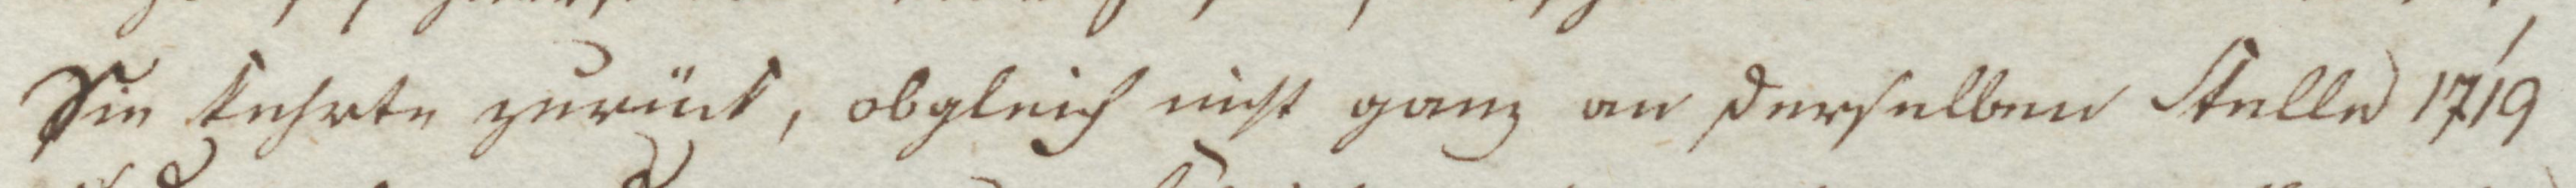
sSie kehrte zurück, obgleich nicht ganz an derselben Stelle 1719
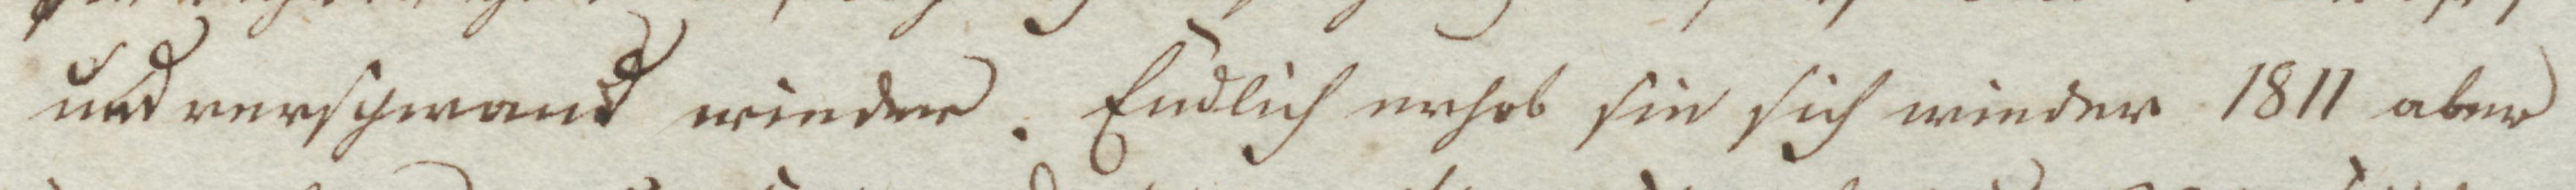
und verschwand wieder. Endlich erhob sie sich wieder 1811 aber
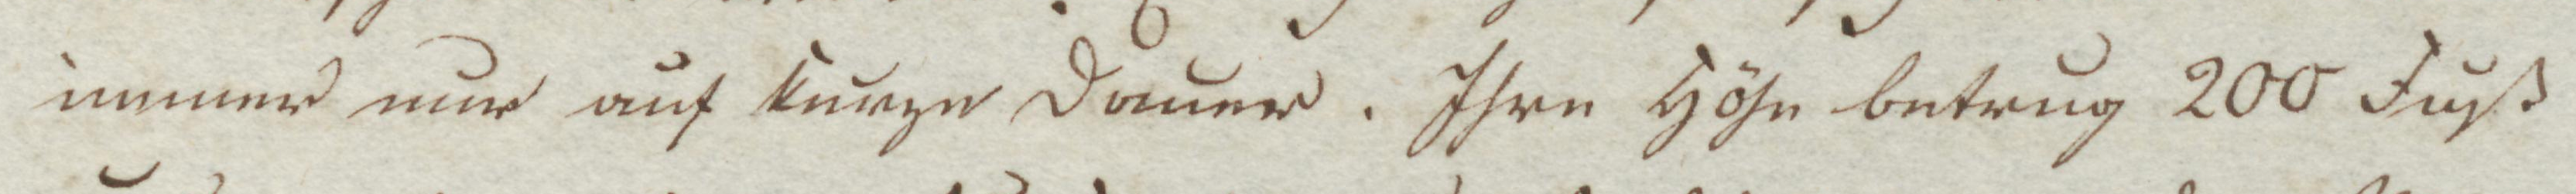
immer nur auf kurze Dauer. Ihre Höhe betrug 200 Fuß
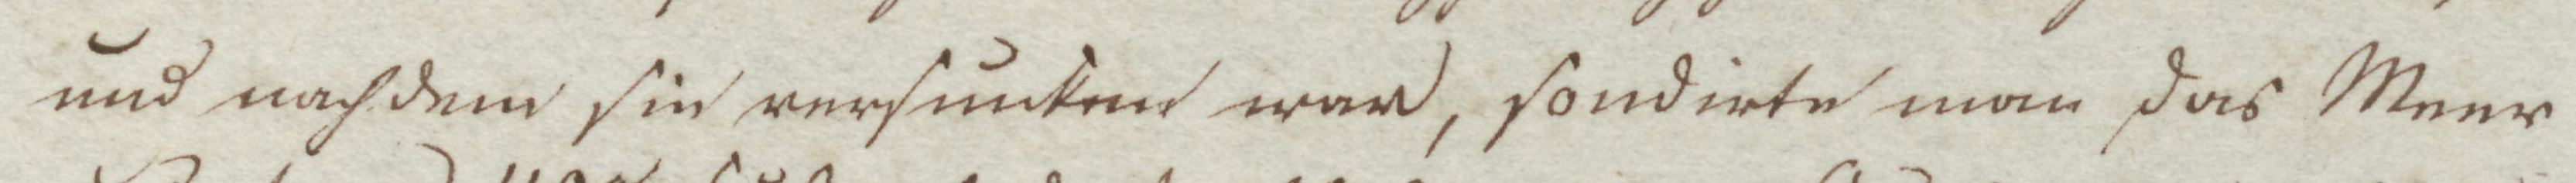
und nachdem sie versunken war, sondirte man das Meer
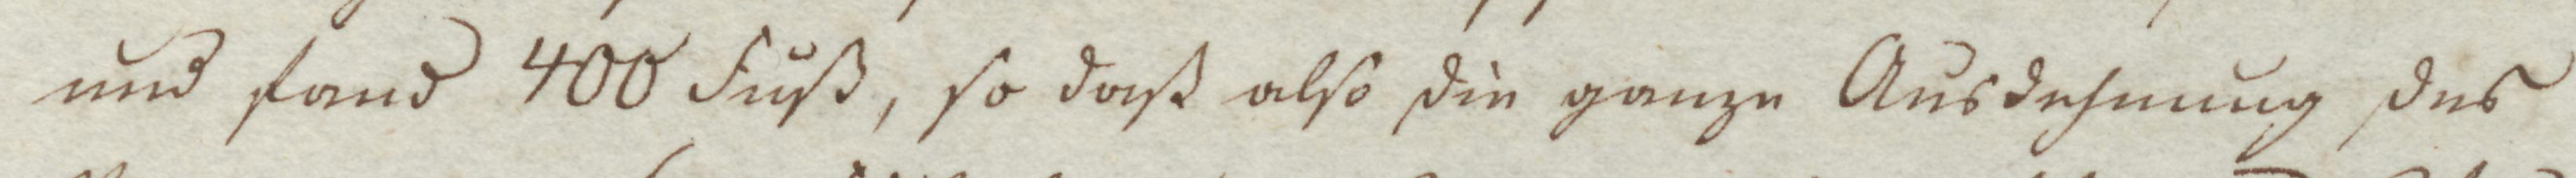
und fand 400 Fuß, so daß also die ganze Ausdehnung des
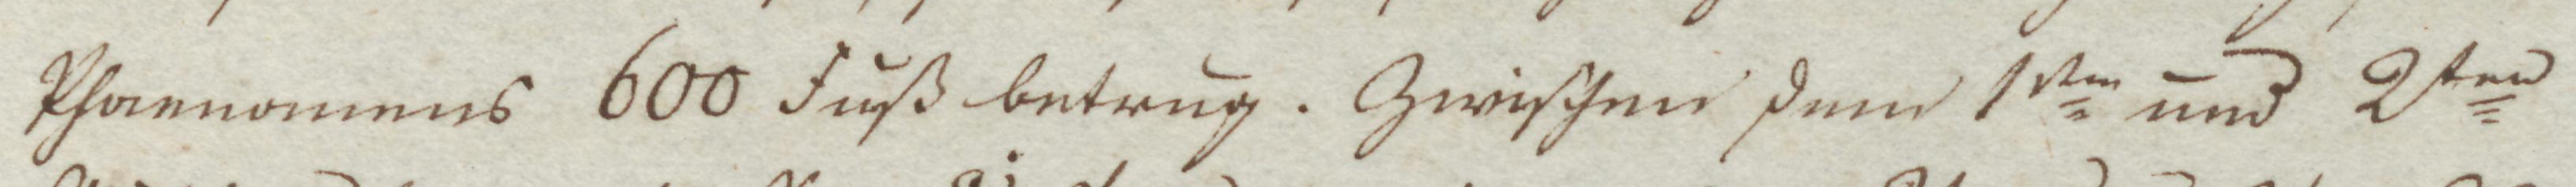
Phaenomens 600 Fuß betrug. Zwischen dem 1ten und 2ten
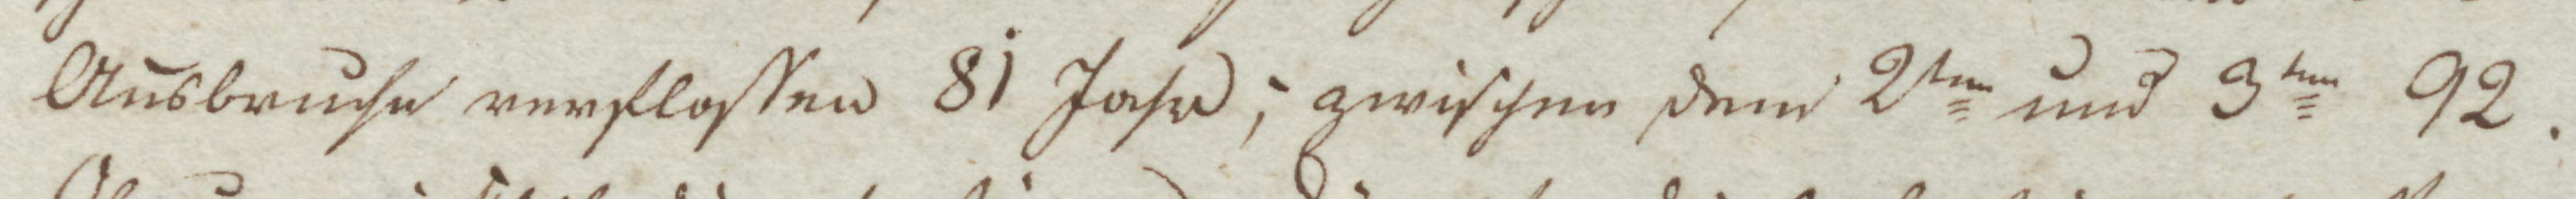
Ausbruche verflossen 81 Jahre; zwischen dem 2ten und 3ten 92.
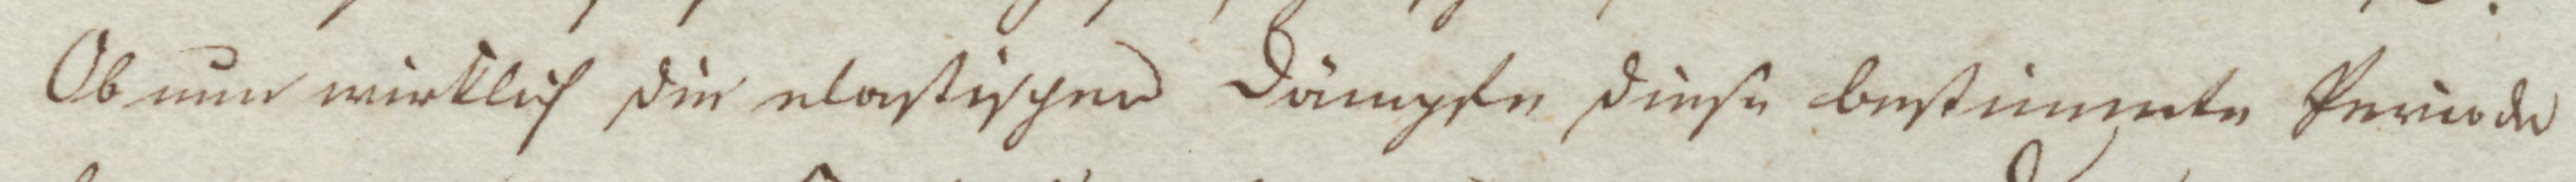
Ob nun wirklich die elastischen Dämpfe diese bestimmte Periode
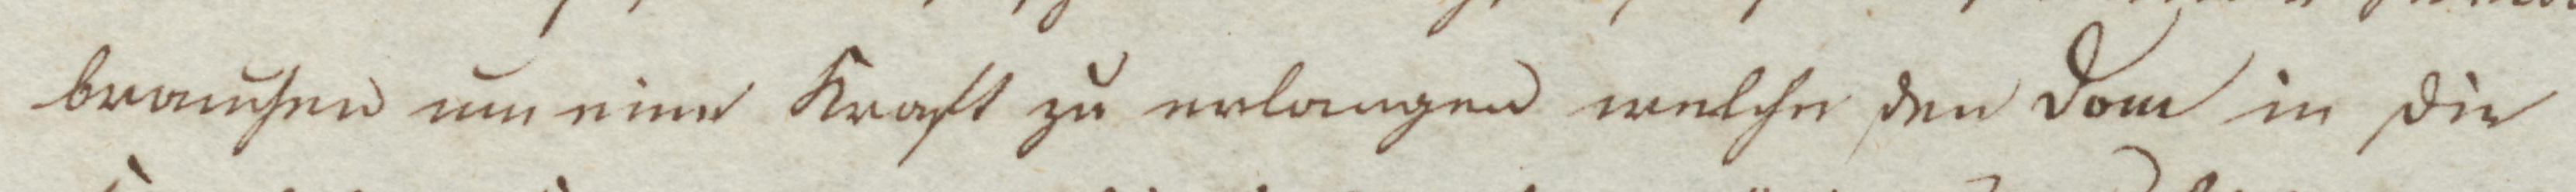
brauchen um eine Kraft zu erlangen welche den Dom in die
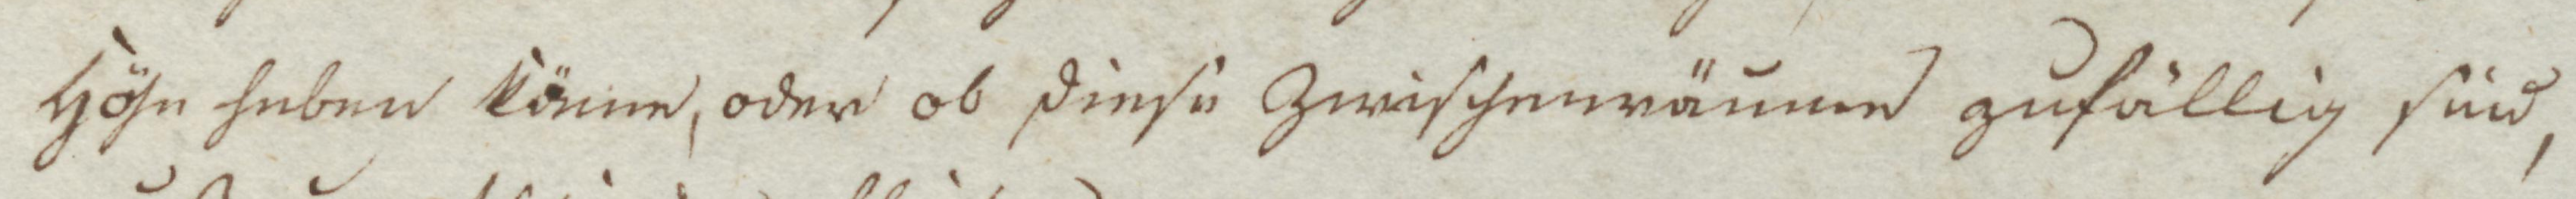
Höhe heben könne, oder ob diese Zwischenräume zufällig sind,
